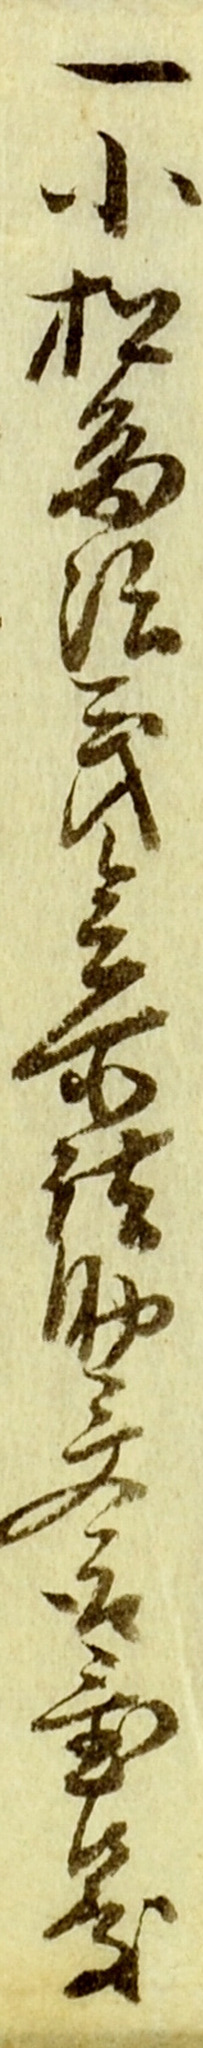一小松団治義会所詰助〆取置候処
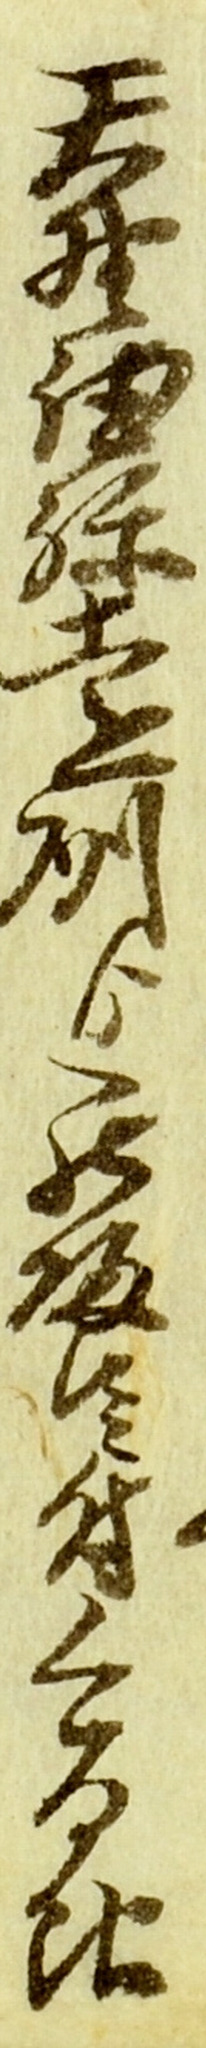天野徳弥遠州ゟ罷帰候ニ付今日限
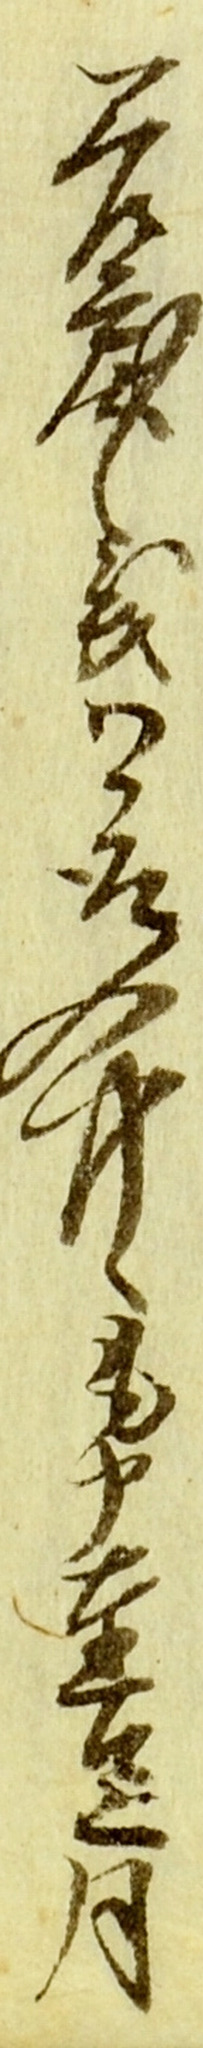差戻之義御取〆中へも申達候迄月
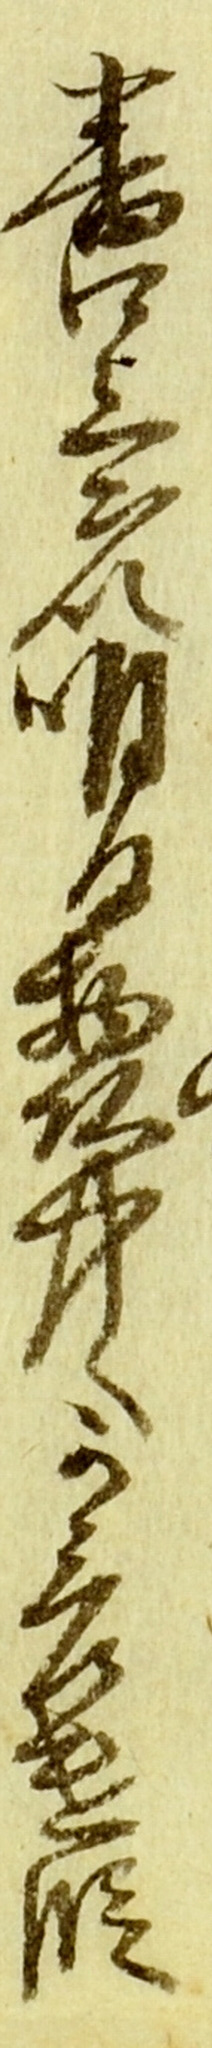番口上ヲ以明日物頭中へ可差遣段
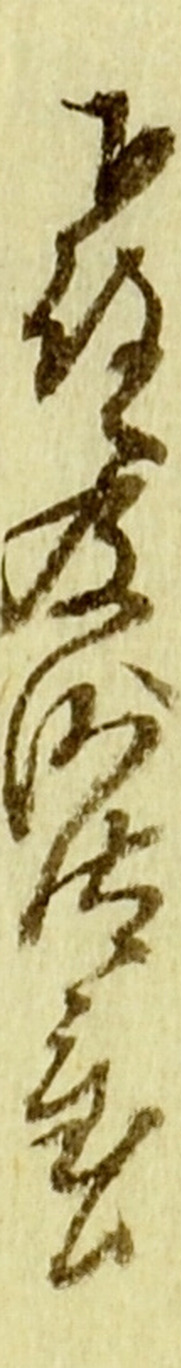下役へ及沙汰置候
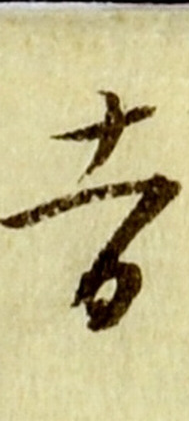十一日
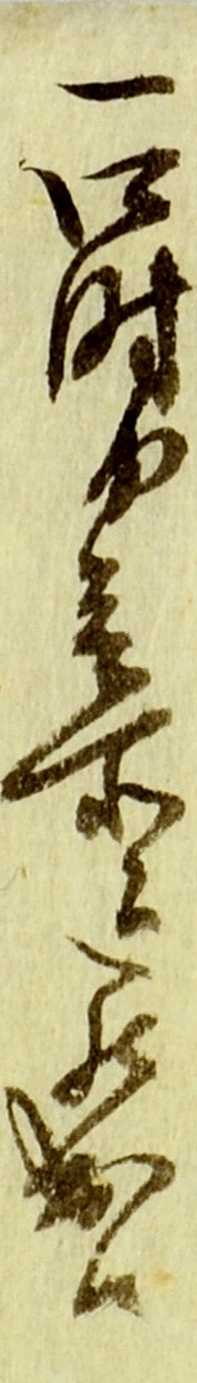一四時ゟ会所ニ罷出候
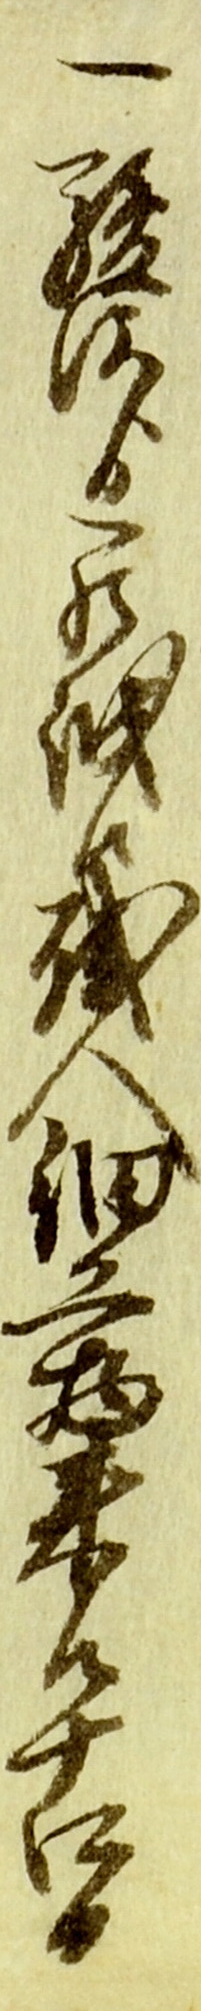一駿河ゟ罷越候職人細工物来ル十四日
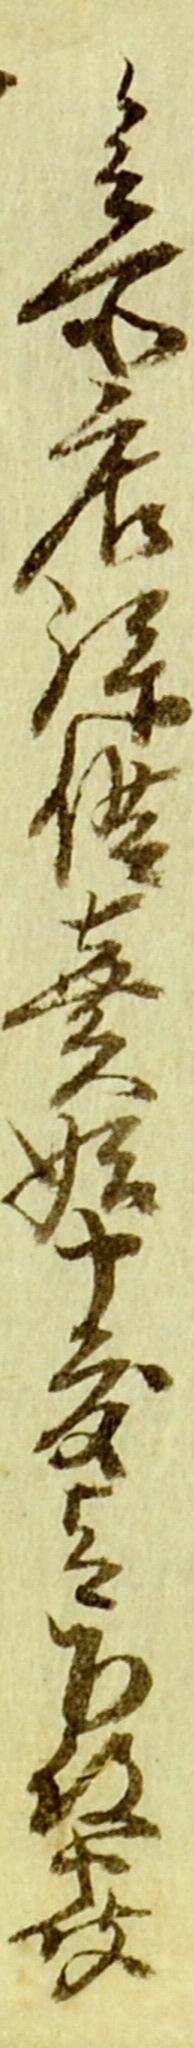会所店拝借売始申度旨下役申聞
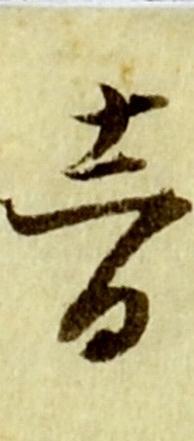十二日
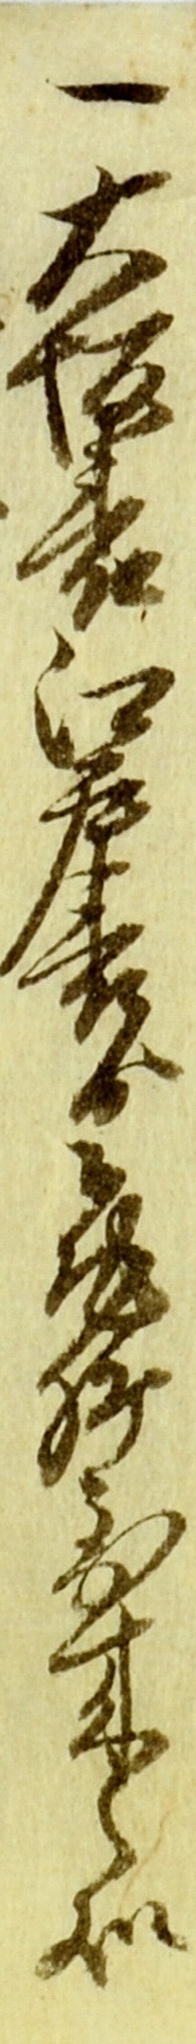一大坂表江戸表ゟ飛脚到来候処
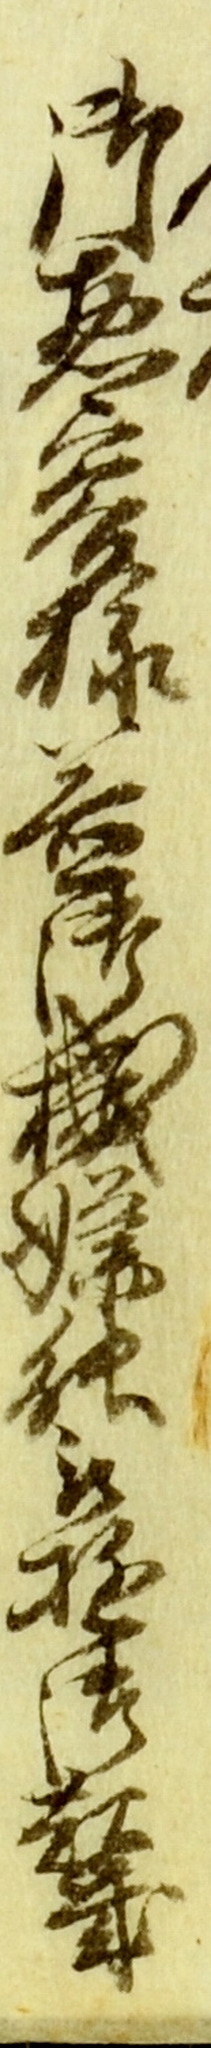御惣容様益御機嫌能被遊御超成
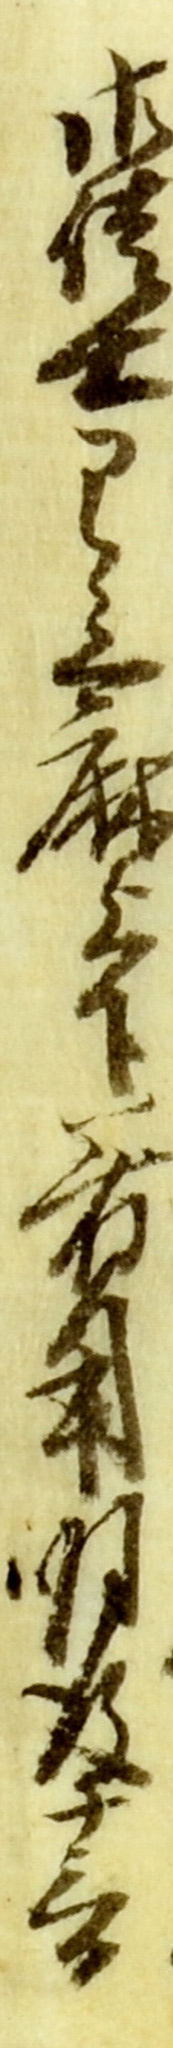御徒士已上麻上下着用明後十三日
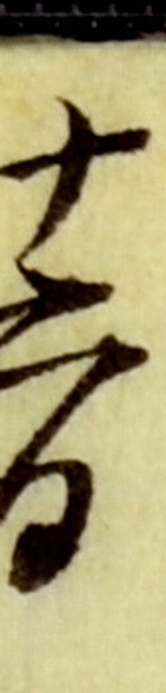十一日

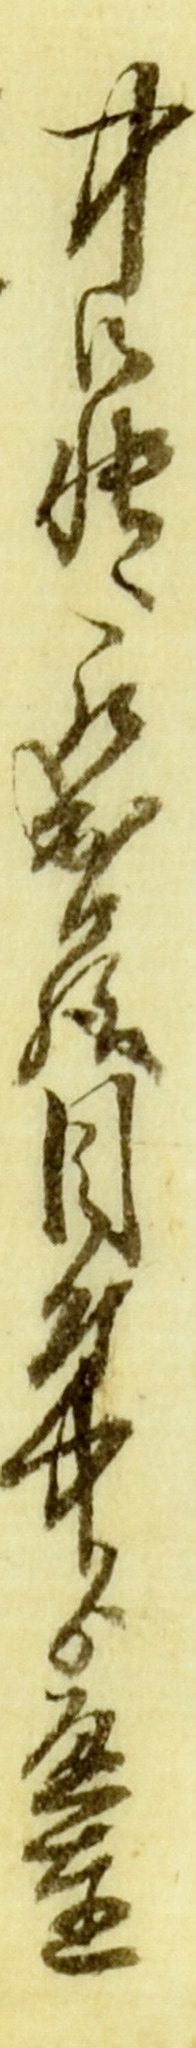中御帳へ罷出候様目付中ゟ通達
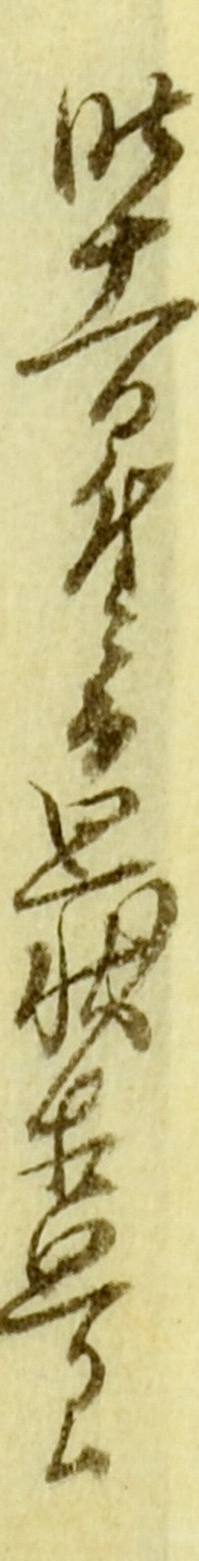昨十一日付ニ而廻状相廻り候
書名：諸事御用留
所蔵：伊那市立高遠町図書館・合同会社AMANE
